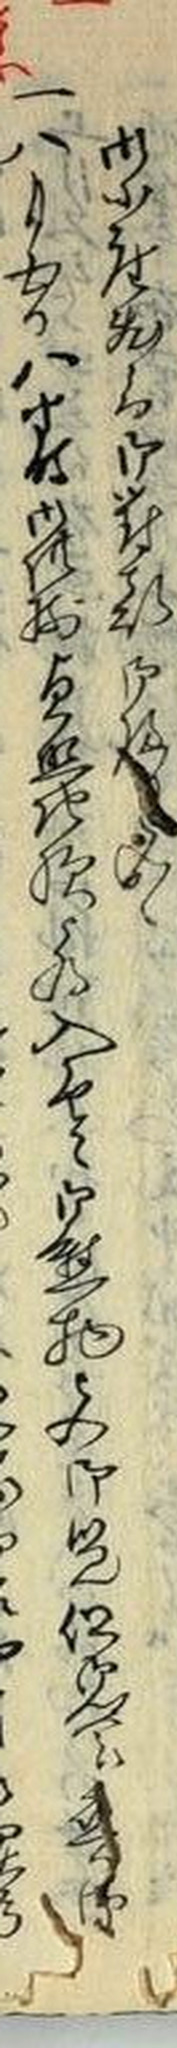一八月五日八半時御供揃貞照院様被為入色々御慰物被入御覧但御饗応ハ御
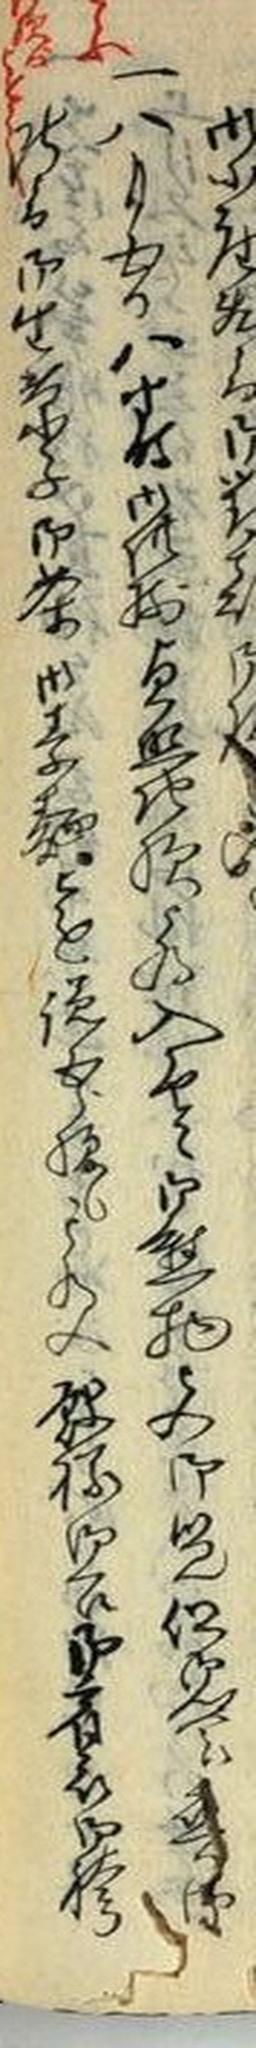断ニ而御生菓子御茶御素麵被進謙五郎様も被為入殿様御召御肩衣御袴
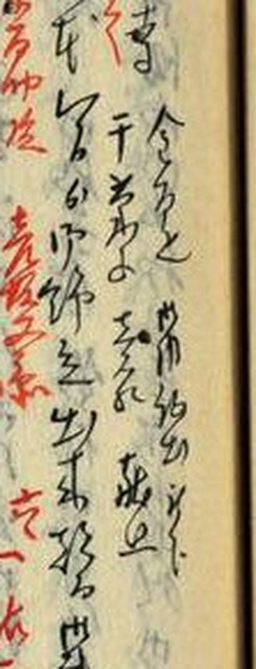干菓子壱箱献上
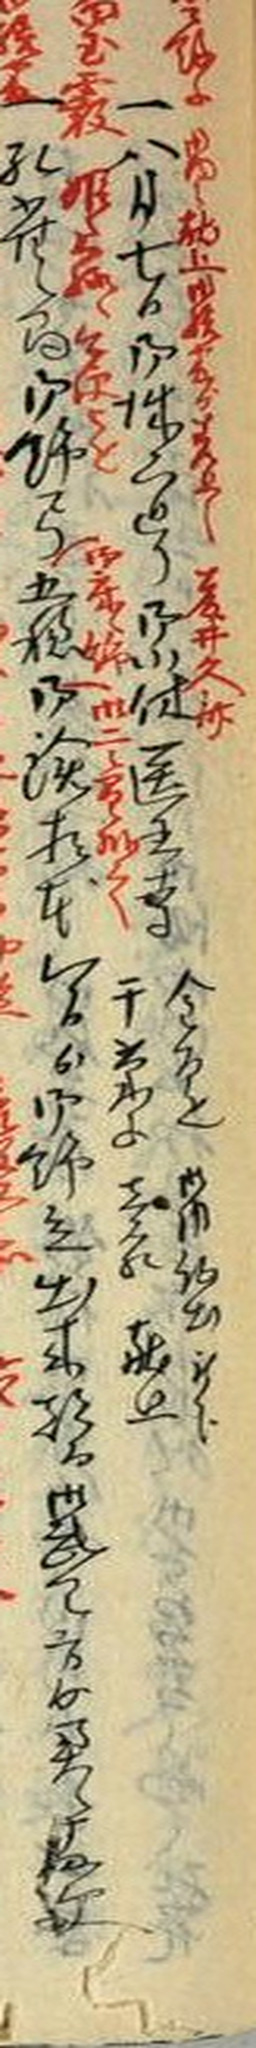一孔雀之間御飾弓五穂御鎗拾本今日ゟ御飾立出来都而御武具方ゟ奥之番受
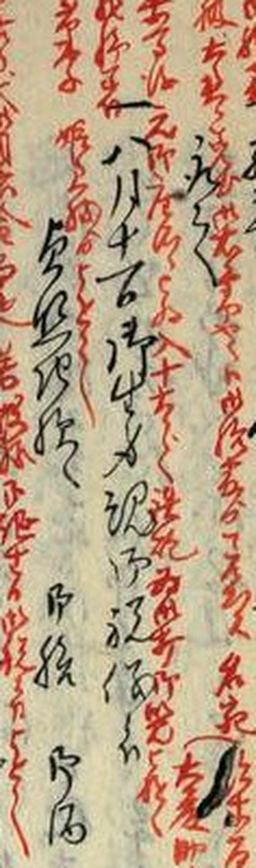一八月十一日御生身魂御祝儀ニ付
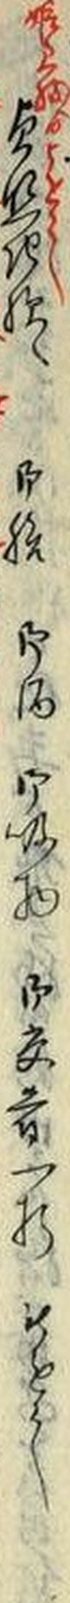貞照院様へ御膳御酒御吸物御交肴一折被進之
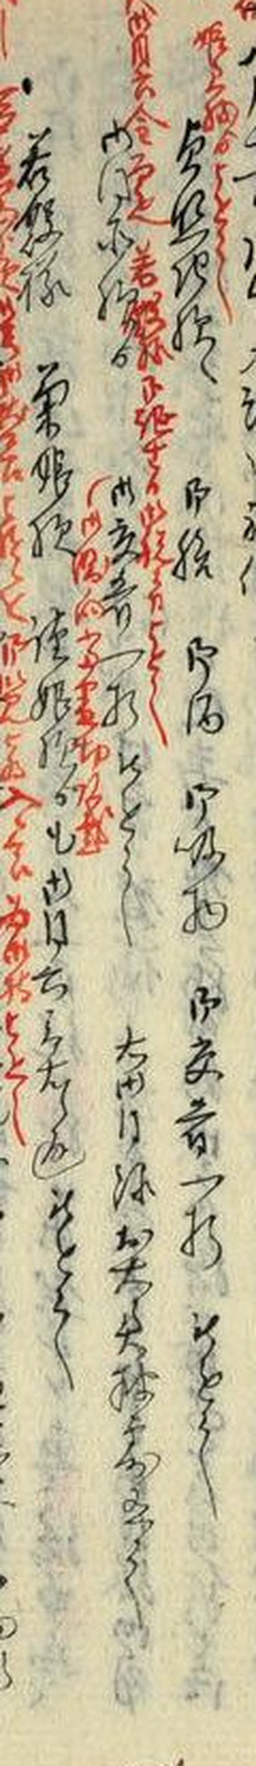御同所様ゟ御交肴一折被進之右御目録於大奥披露有之
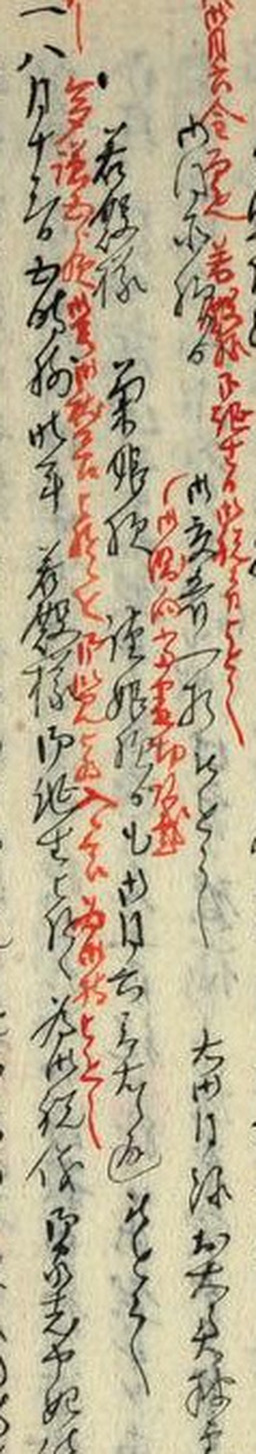若殿様菊姫様謹姫様ゟも御目六ニ而右之通被進之
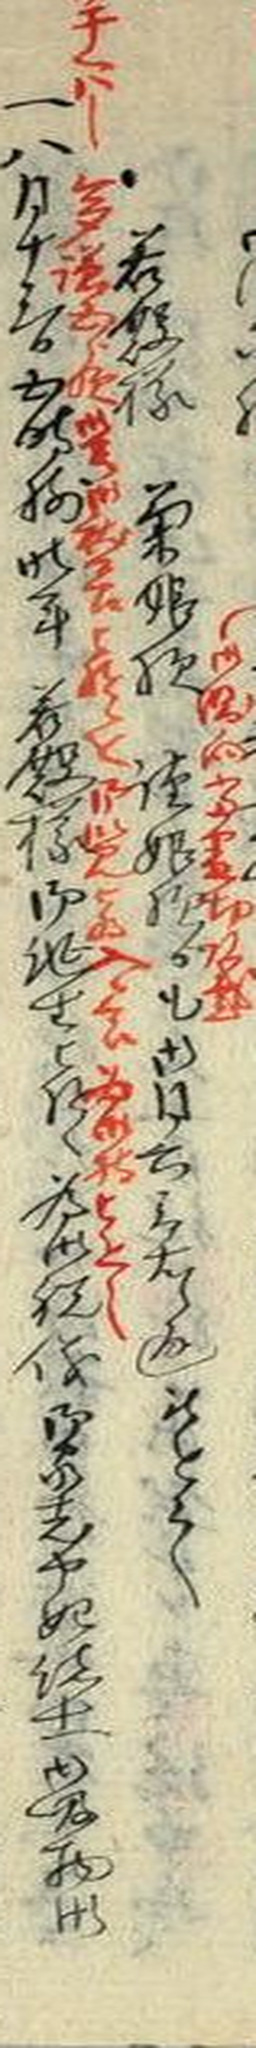一八月十三日五時揃昨年若殿様御誕生被遊候為御祝儀御家老中始諸士御吸物御
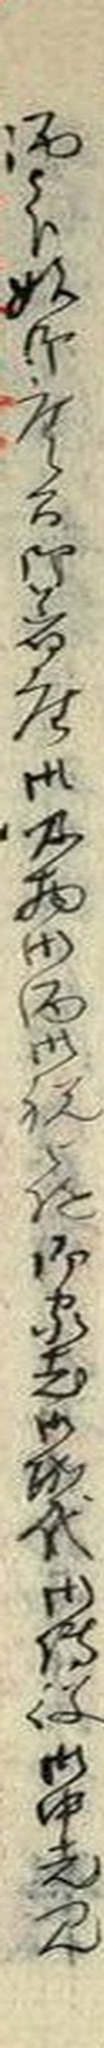酒被下始御座之間御着座御吸物御酒御祝被遊御家老御城代御傅役御中老見
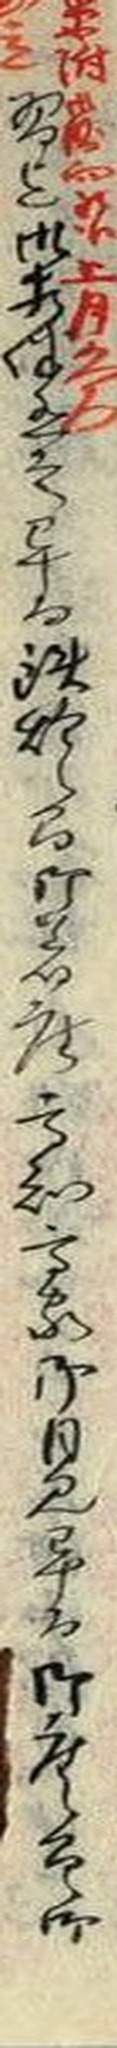習迄御相伴有之畢而鉄炮之間御着座高知高家御目見畢而御座之間へ御
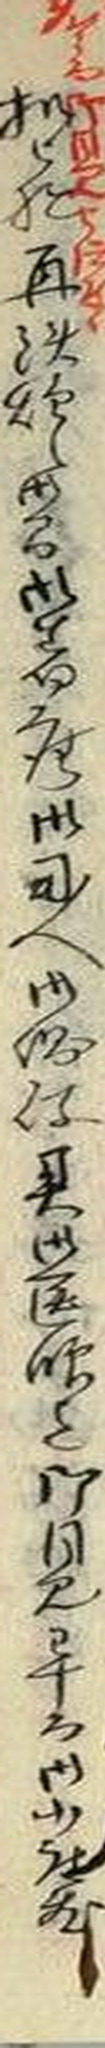控被遊再鉄炮之御間御着座御用人御側役奥御医師迄御目見畢而御小座敷
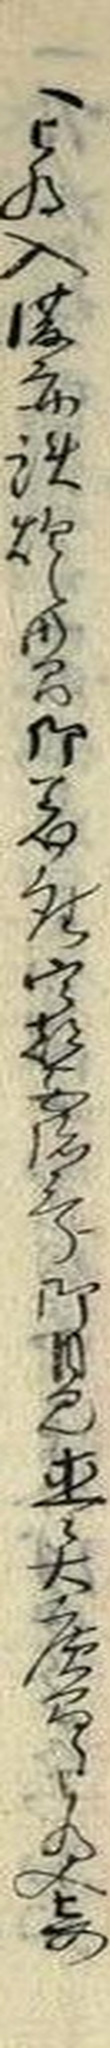へ被為入復亦鉄炮之御間御着座宇都宮弥三郎御目見直ニ大広間へ被為入寄
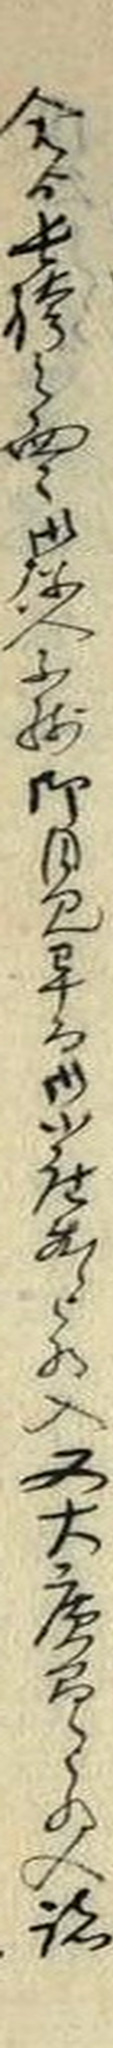合ゟ長袴之面々御役人不残御目見畢而御小座敷へ被為入又大広間へ被為入諸
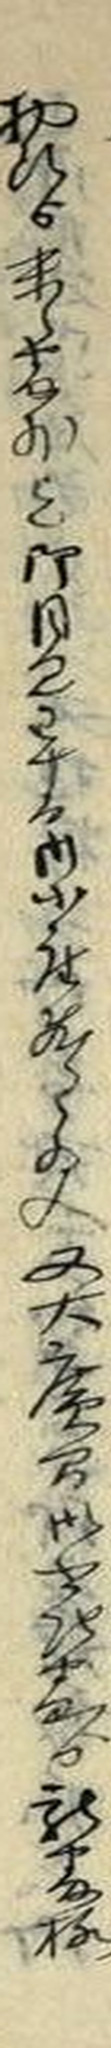物頭ゟ末之番外迄御目見畢而御小座敷へ被為入又大広間御書院番ゟ新番格

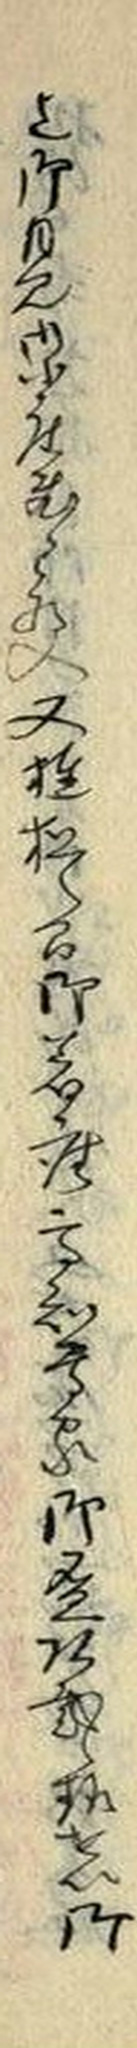迄御目見御小座敷へ被為入又韃靼之間御着座高知高家御盃頂戴之趣を以御
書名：少傅日録抄（斉承付側向頭取日記、在国）
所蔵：福井県文書館 Fukui Prefectural Archives
